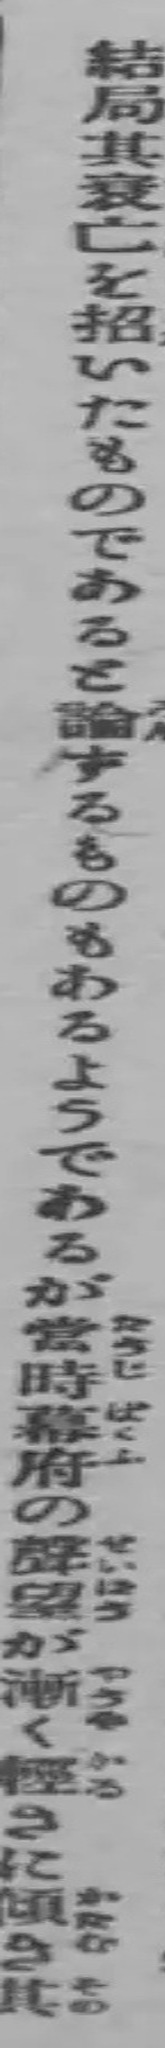結局其衰亡を招いたものであると論ずるものもあるようであるが当時幕府の声望が漸く軽きに傾き其
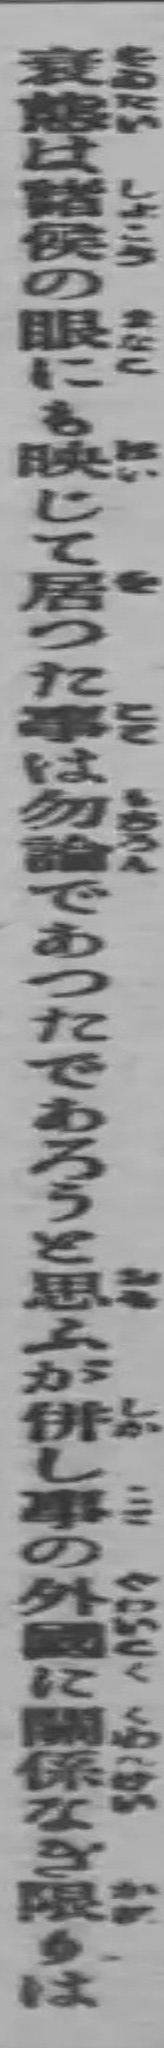衰態は諸侯の眼にも映じて居つた事は勿論であつたであろうと思ふが併し事の外国に関係なき限りは
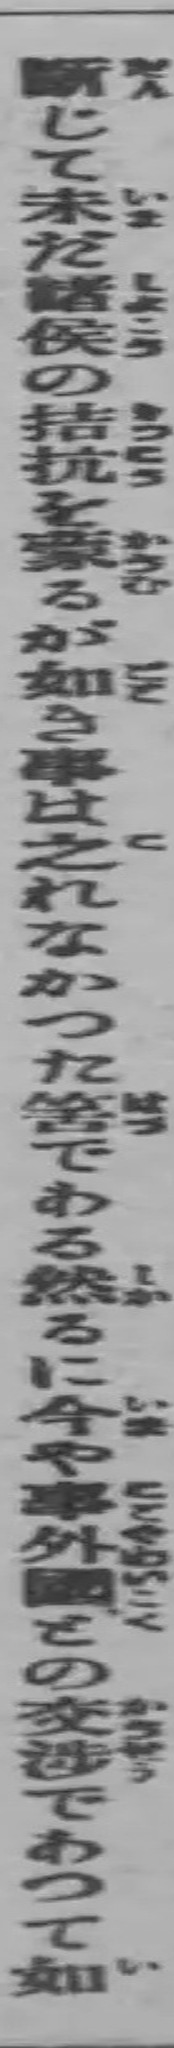断じて未だ諸侯の拮抗を蒙るが如き事は之れなかつた筈である然るに今や事外国との交渉であつて如
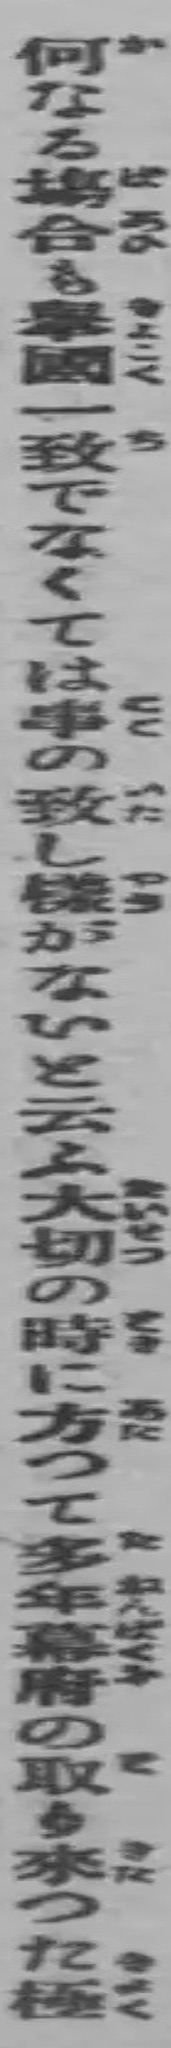何なる場合も挙国一致でなくては事の致し様がないと云ふ大切の時に方つて多年幕府の取り来つた極
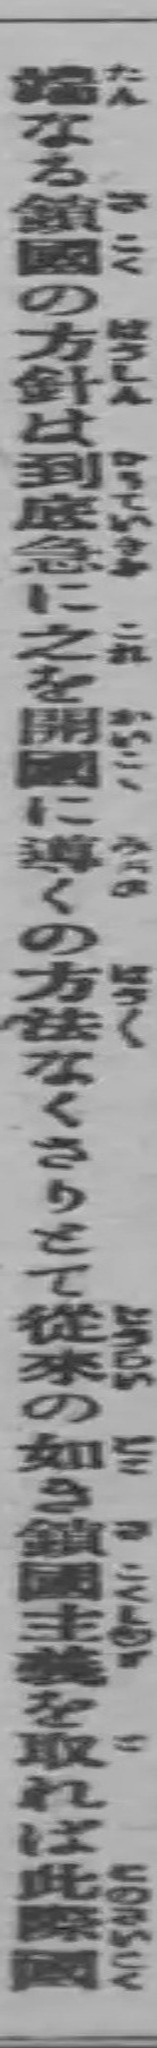端なる鎖国の方針は到底急に之を開国に導くの方法なくさりとて従来の如き鎖国主義を取れば此際国
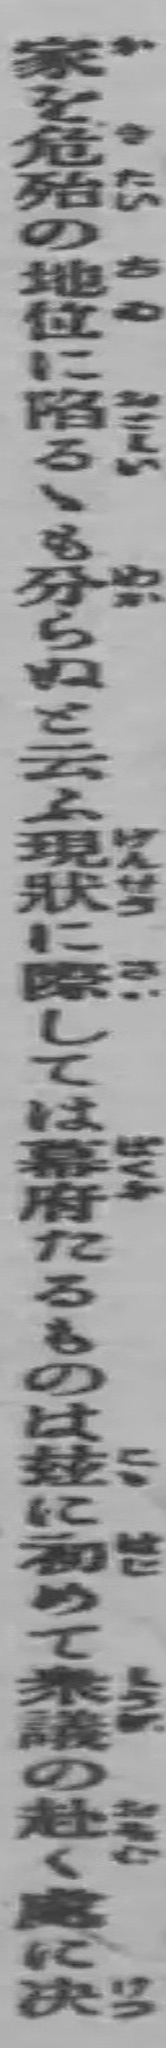家を危殆の地位に陥るゝも分らぬと云ふ現状に際しては幕府たるものは茲に初めて衆議の赴く処に決
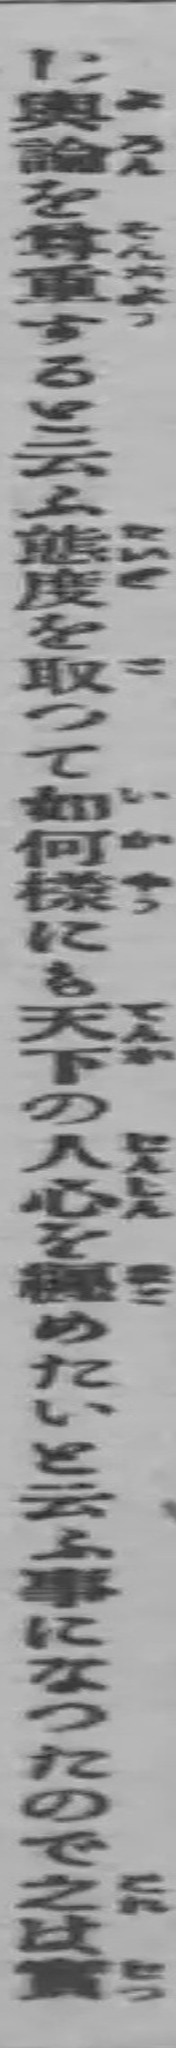し与論を尊重すると云ふ態度を取つて如何様にも天下の人心を纏めたいと云ふ事になつたので之は実
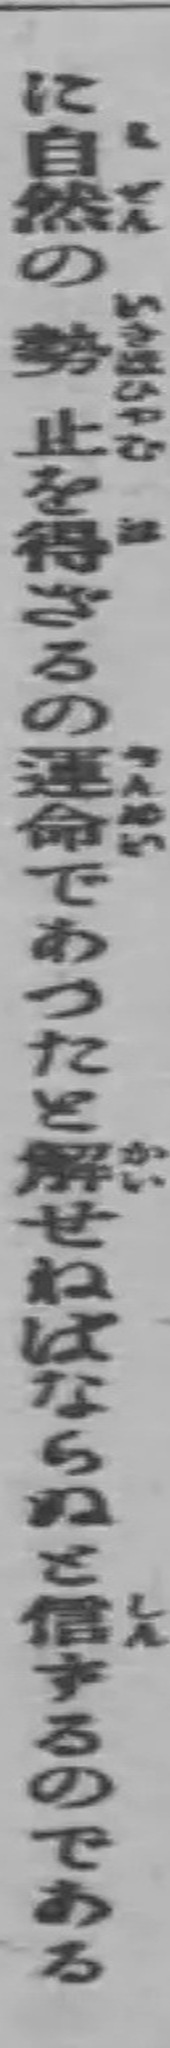に自然の勢止を得ざるの運命であつたと解せねばならぬと信ずるのである
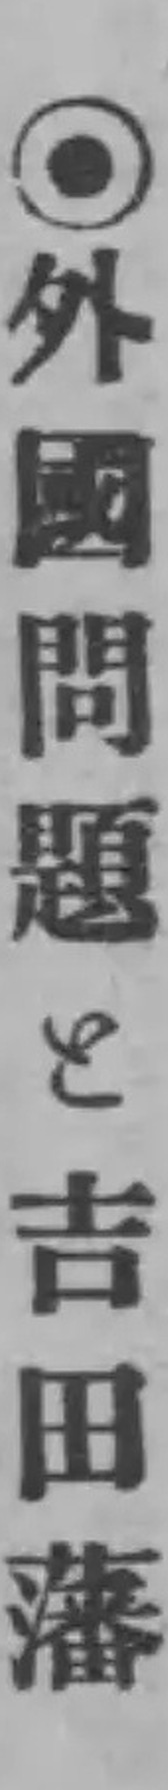⦿外国問題と吉田藩
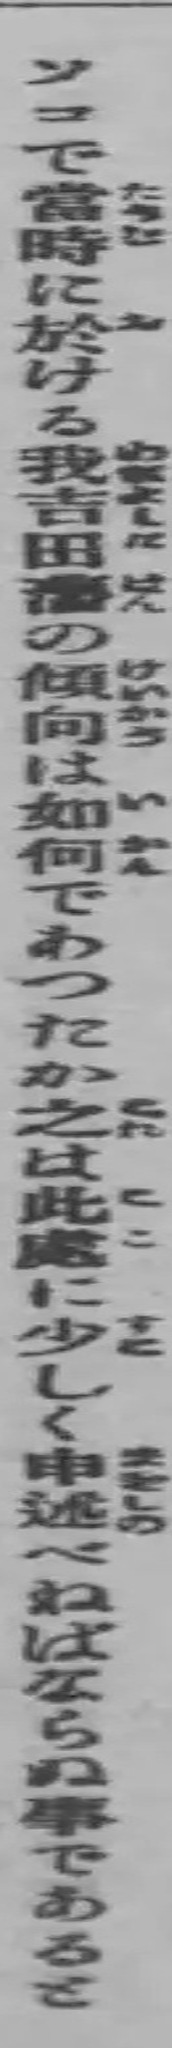ソコで当時に於ける我吉田藩の傾向は如何であつたか之は此処に少しく申述べねばならぬ事であると
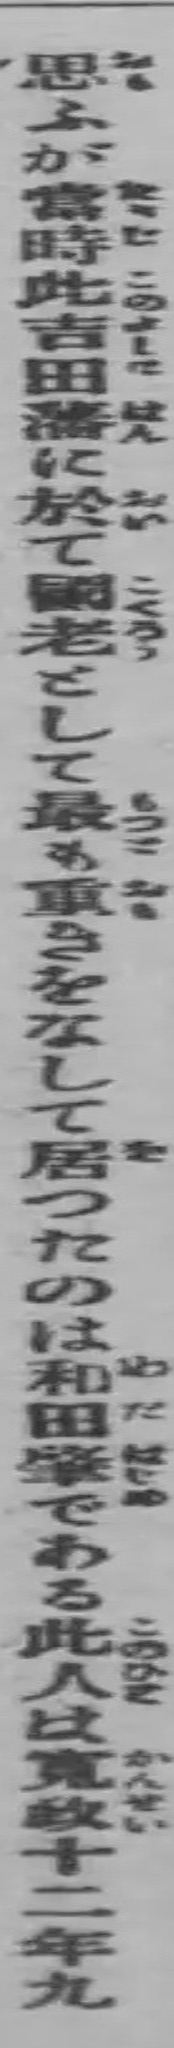和田肇思ふが当時此吉田藩に於て国老として最も重きをなして居つたのは和田肇である此人は寛政十二年九
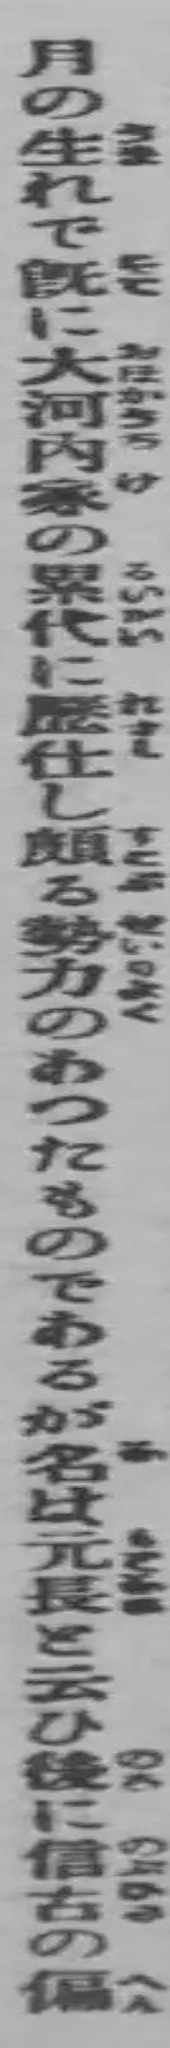月の生れで既に大河内家の累代に歴仕し頗る勢力のあつたものであるが名は元長と云ひ後に信古の偏
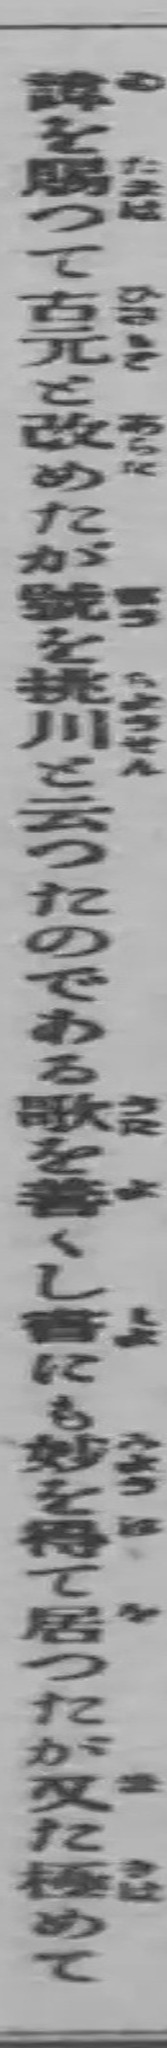諱を賜つて古元と改めたが号を挑川と云つたのである歌を善くし書にも妙を得て居つたが又た極めて
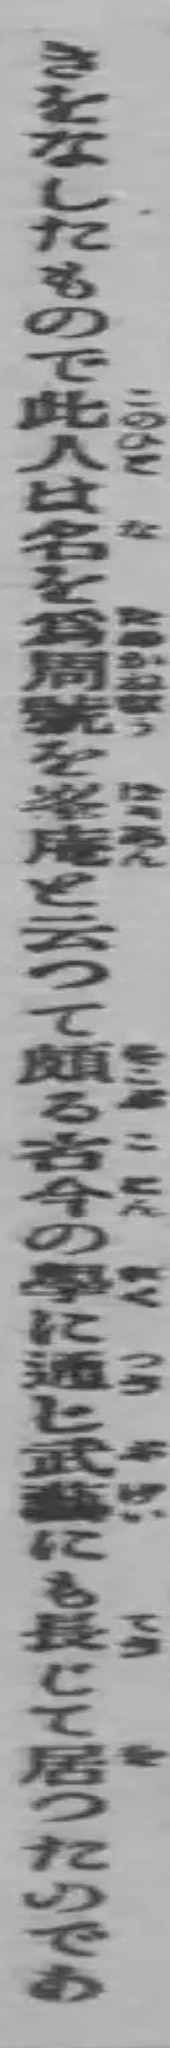きをなしたもので此人は名を為周号を峯庵と云つて頗る古今の学に通じ武芸にも長じて居つたのであ
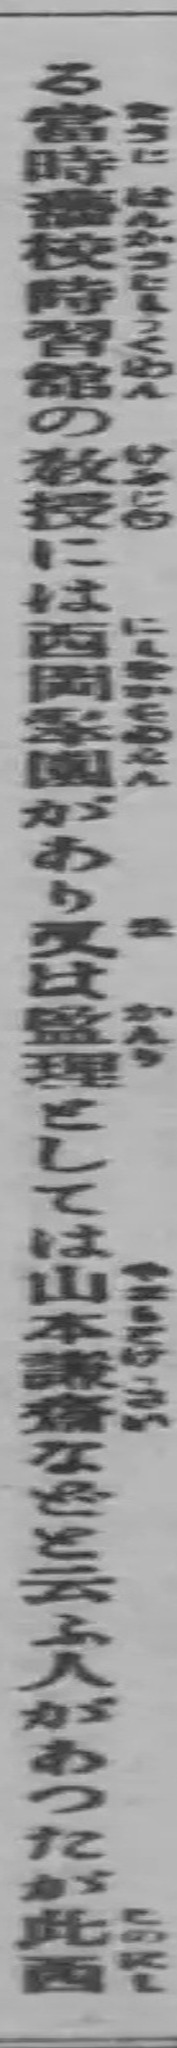西岡翠園る当時藩校時習館の教授には西岡翠園があり又は監理としては山本謙斉などと云ふ人があつたが此西
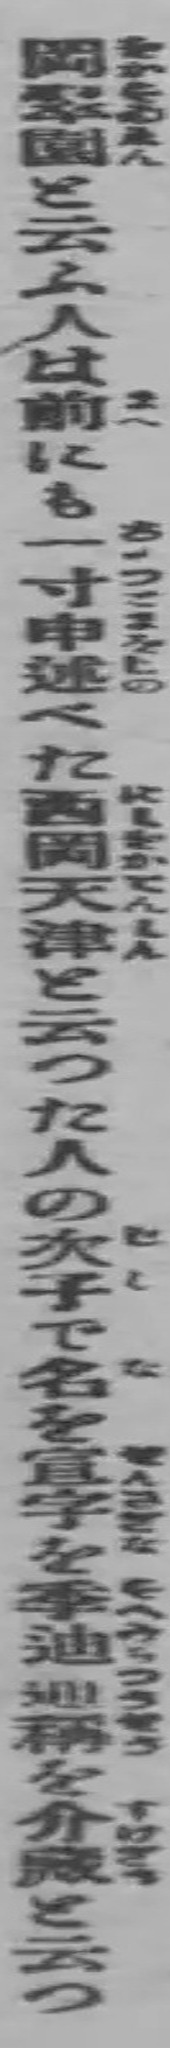岡翠園と云ふ人は前にも一寸申述べた西岡天津と云つた人の次子で名を宣字を季廸通称を介蔵と云つ
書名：豊橋市史談
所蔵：国立国会図書館 National Diet Library, JAPAN
